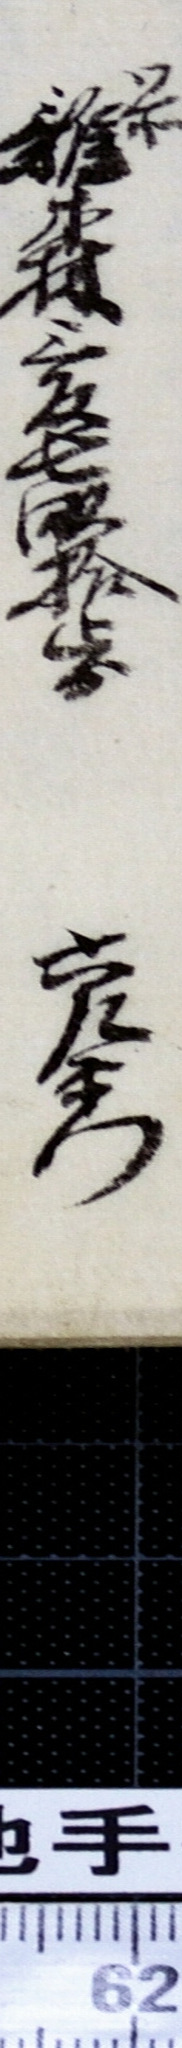雑木林三反七畝拾歩六左衛門
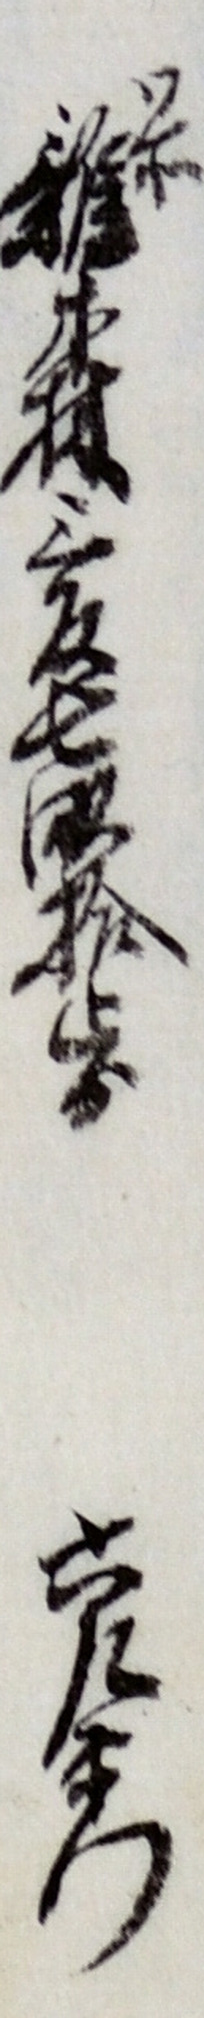雑木林三反七畝拾歩六左衛門
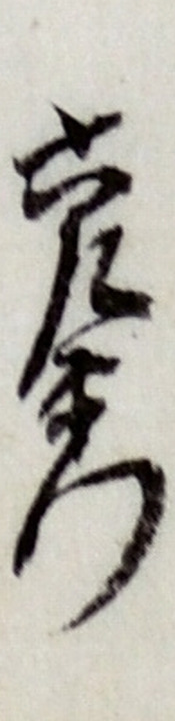六左衛門
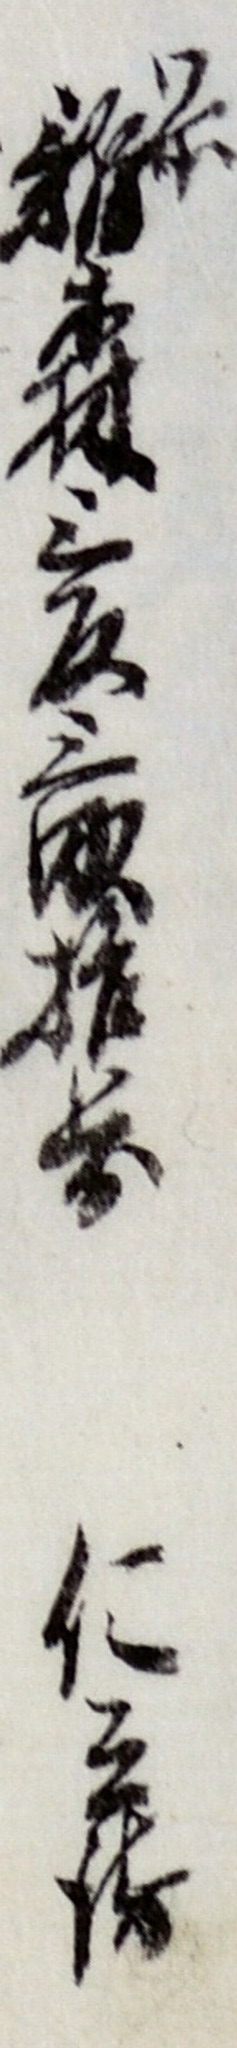雑木林三反三畝拾歩仁兵衛
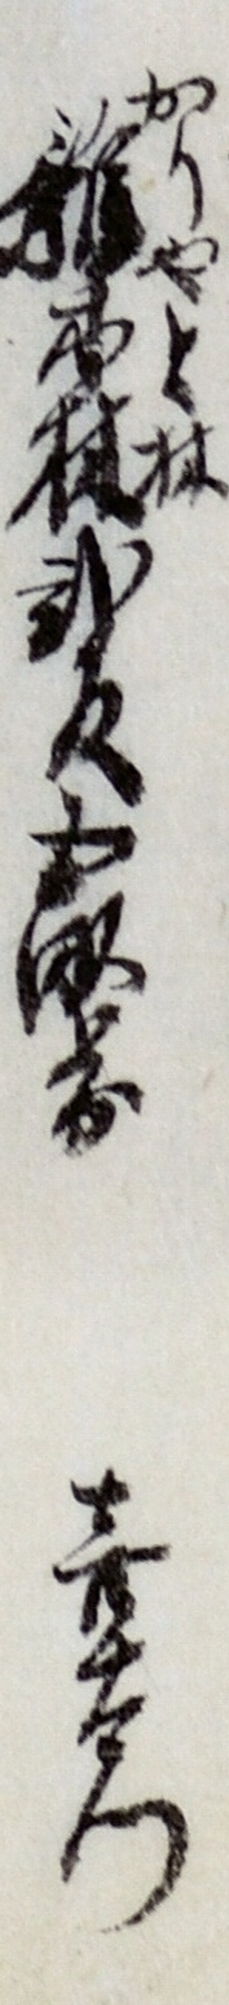雑木林弐反五畝歩喜右衛門
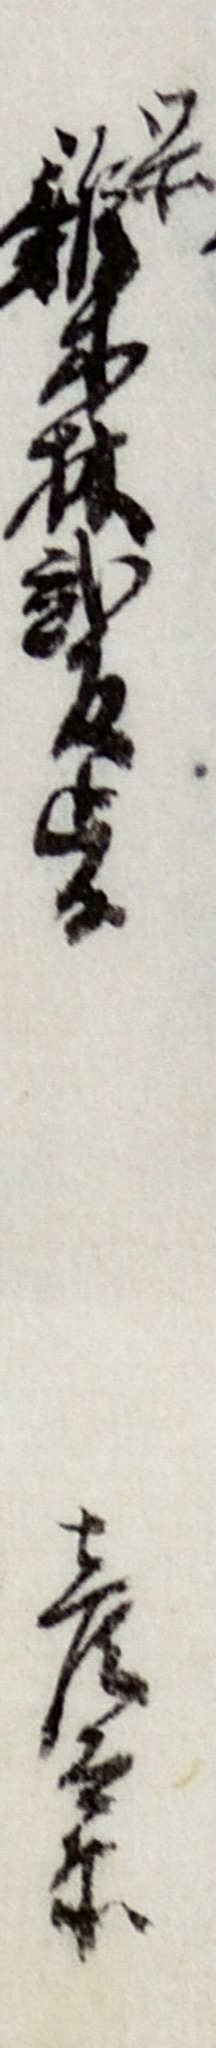雑木林弐反歩彦兵衛
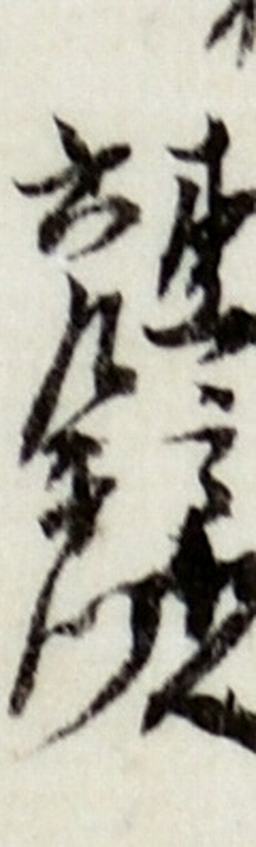六左衛門
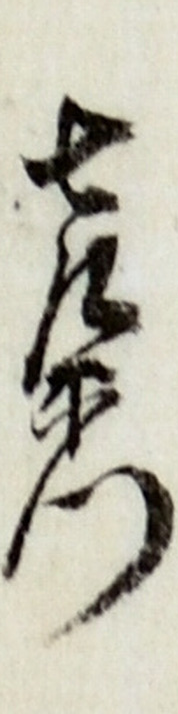六左衛門
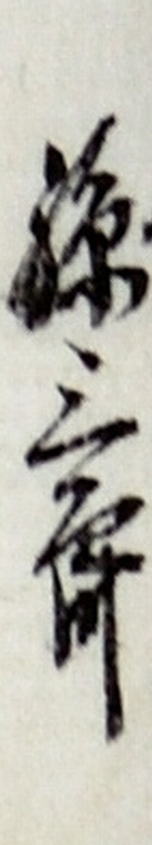孫三郎
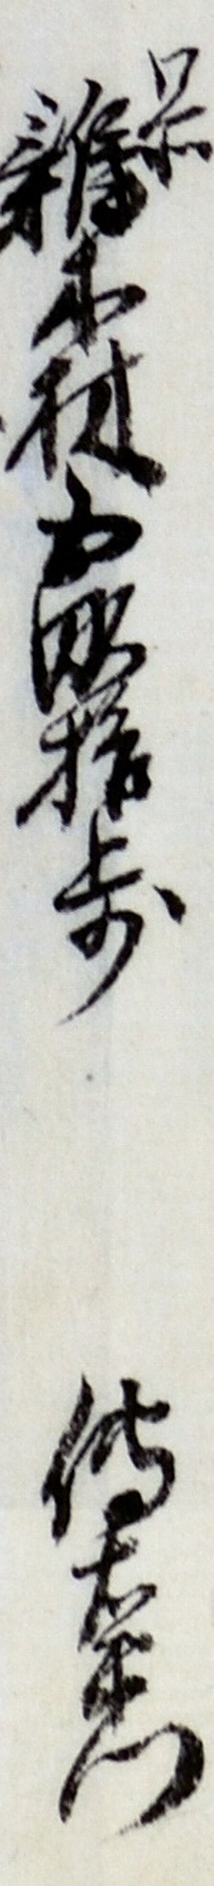雑木林五畝拾歩伝右衛門
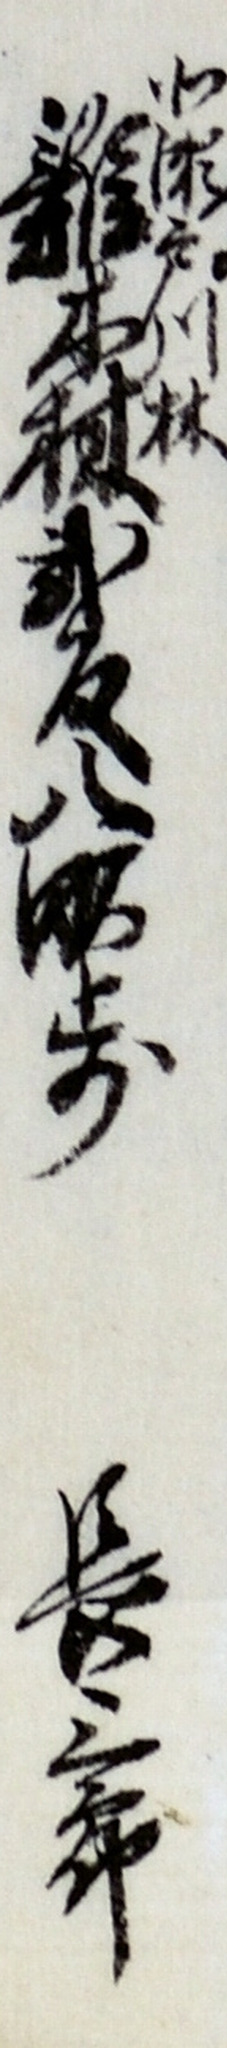雑木林弐反八畝歩長三郎
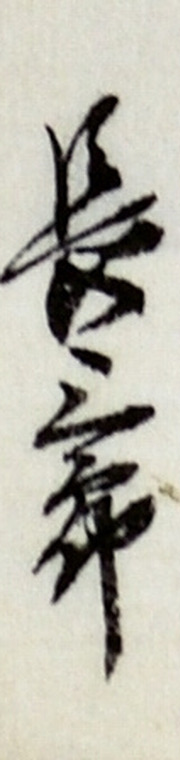孫三郎
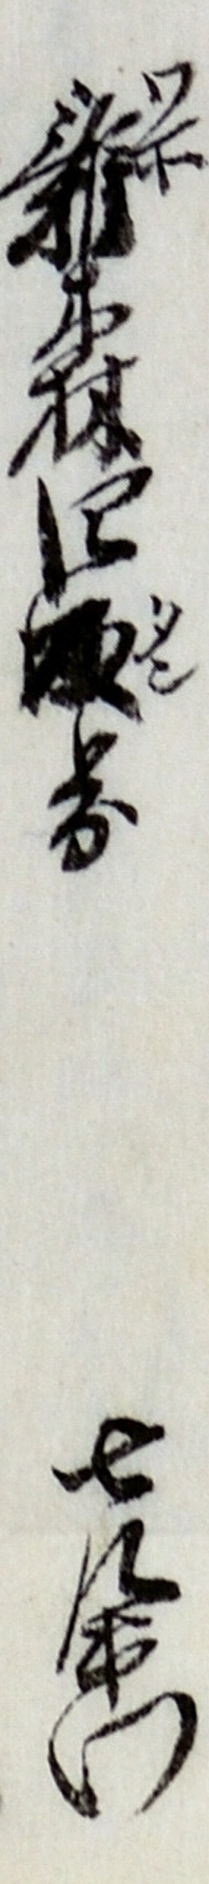雑木林弐反歩九右衛門
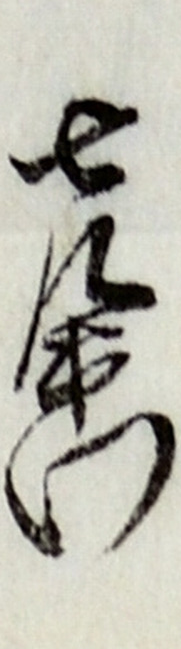六左衛門
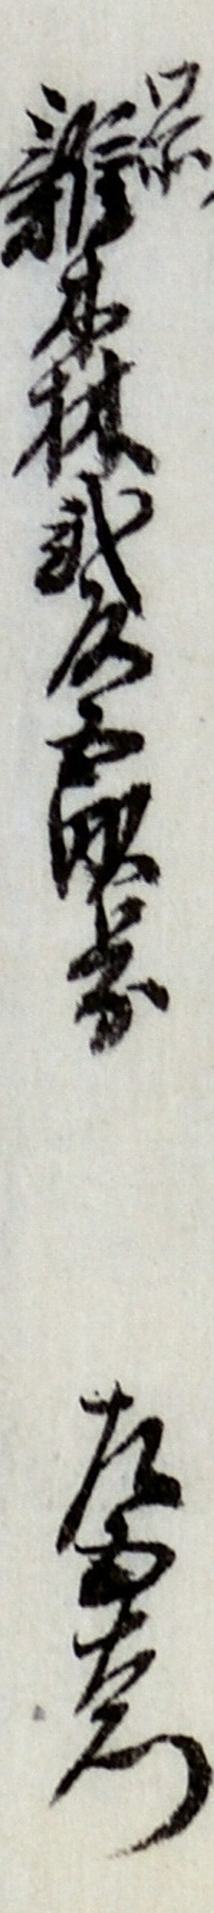雑木林弐反五畝歩左五右衛門
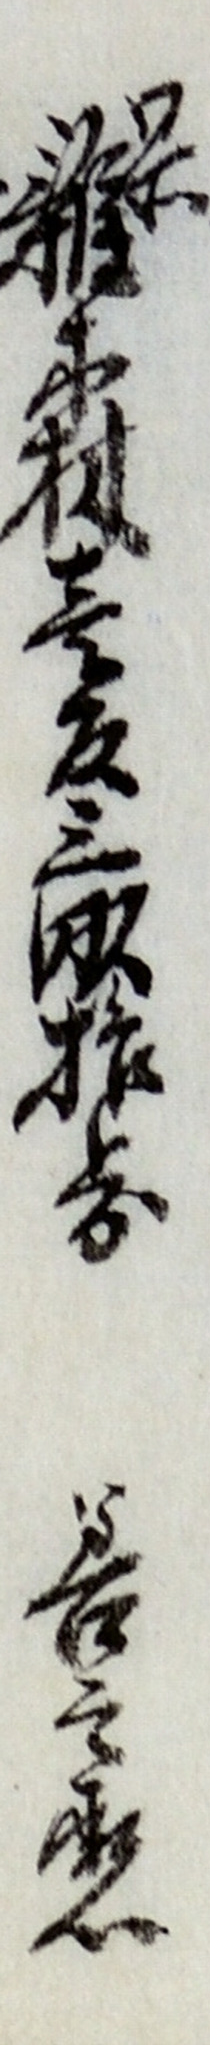雑木林壱反三畝拾歩善之烝
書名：御領分中山林社地手控
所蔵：伊那市立高遠町図書館・合同会社AMANE
